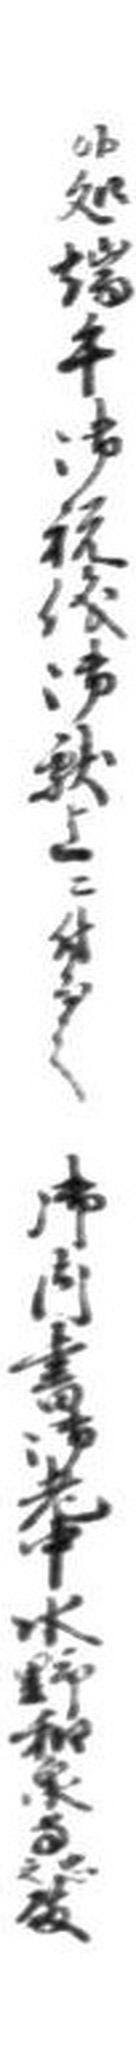候処端午御祝儀御献上二付而之御内書御老中水野和泉守忠之殿
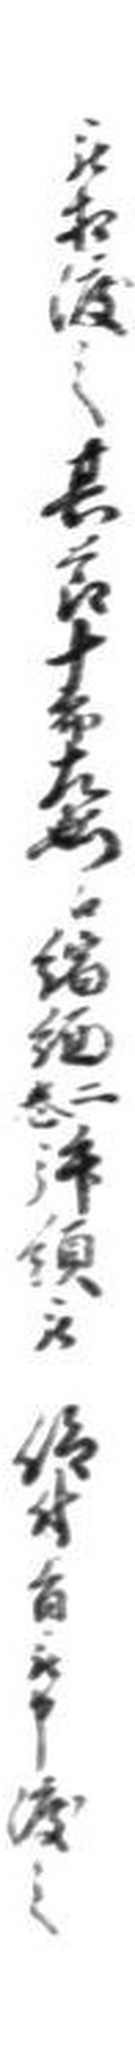被相渡之其節十郎左衛門江縮緬二巻拝領被仰付旨申渡之
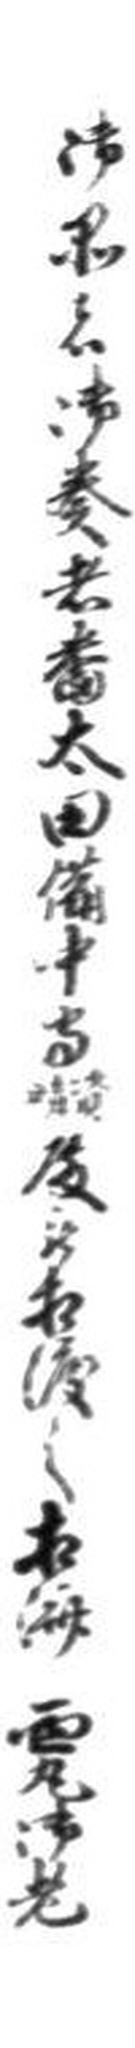御品者御奏者番太田備中守資晴殿被相渡之相済

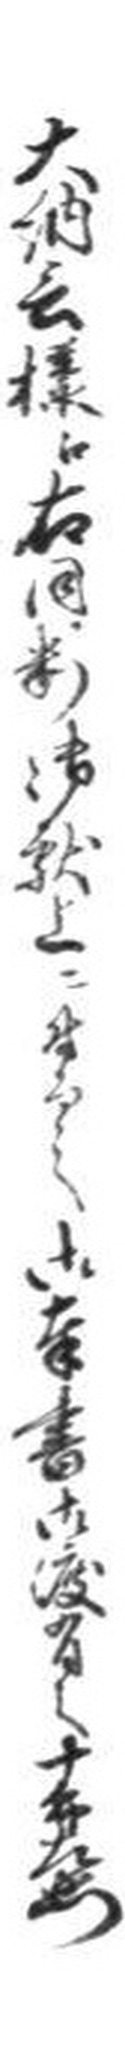大納言様江右同断御献上二付而之御奉書御渡有之十郎左衛門
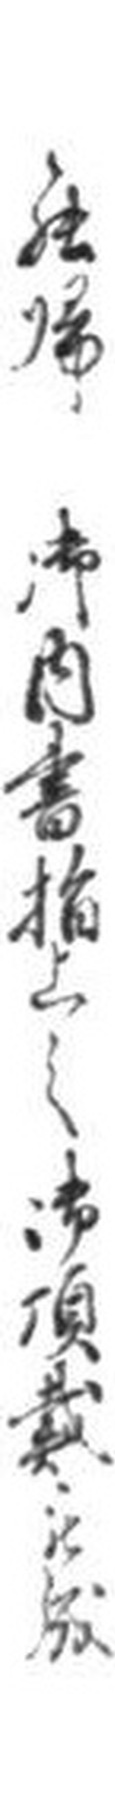罷帰御内書指上之御頂戴被成
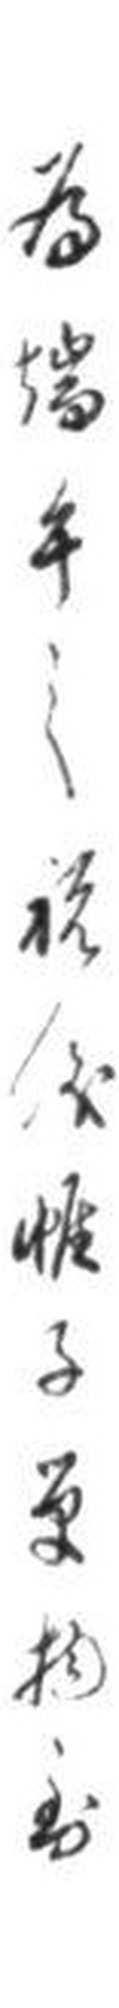為端午之祝儀帷子単物致
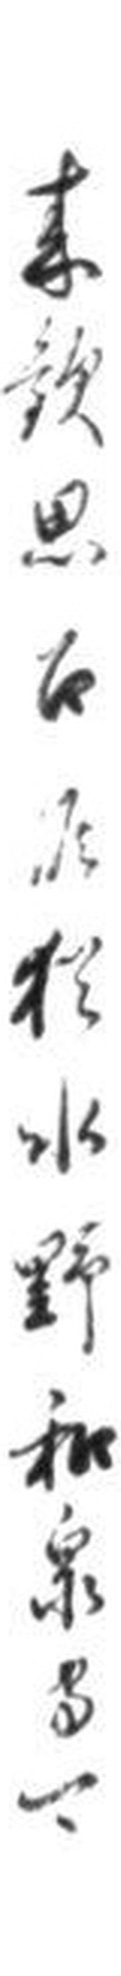来歓思召候猶水野和泉守可
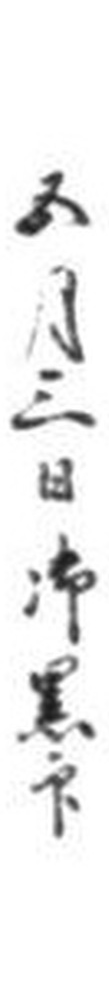五月三日御黒印
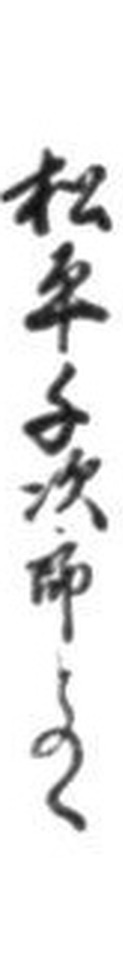松平千次郎とのへ
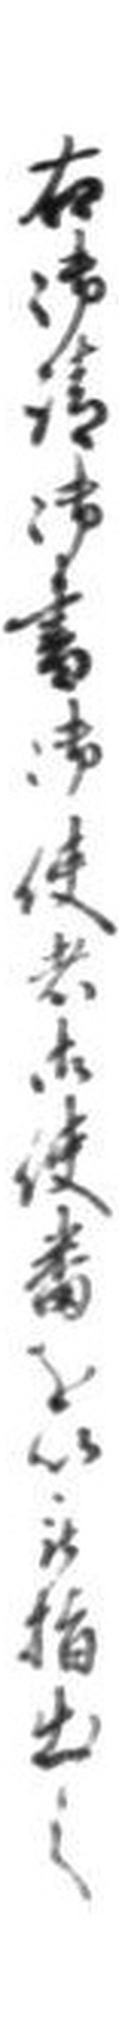右御請御書御使者御使番を以被指出之
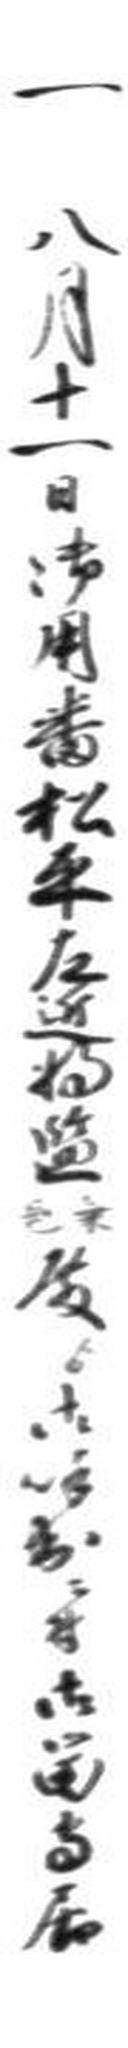一八月十一日御用番松平左近将監乗邑殿ゟ御呼出ニ付御留守居
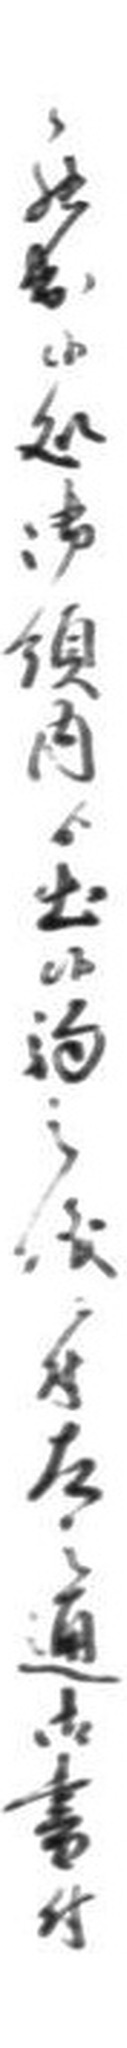罷出候処御領内ゟ出候駒之儀ニ付左之通御書付
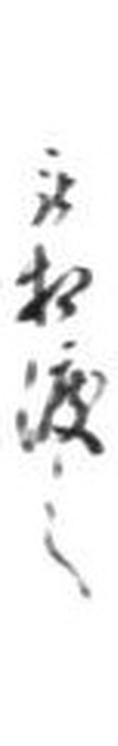被相渡之
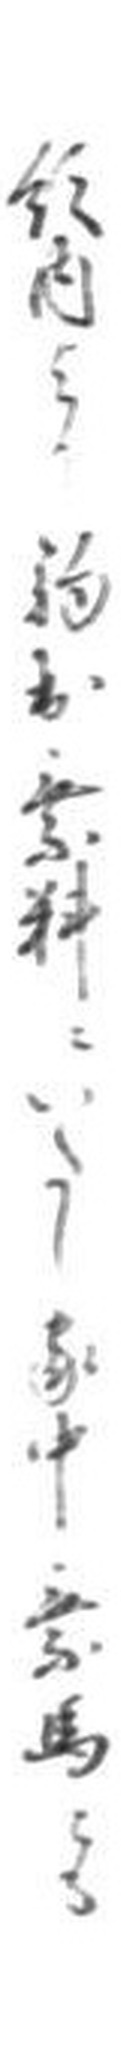領内与り駒出乗料ニいたし家中乗馬ニ而致
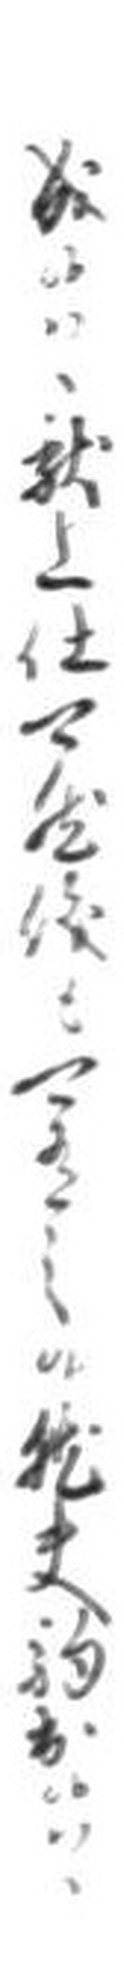成候ハヽ献上仕可然儀も可有之候就夫駒出候ハヽ
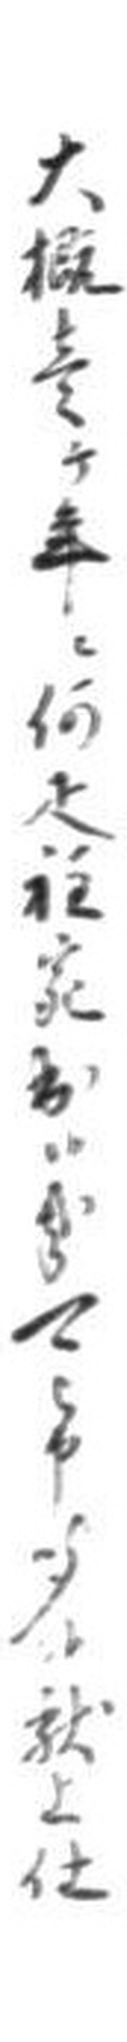大概壱ケ年ニ何疋程宛出候哉可被申聞候献上仕
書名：家譜 四十 宗矩公 従享保十一年到享保十二年
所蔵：福井県文書館 Fukui Prefectural Archives
